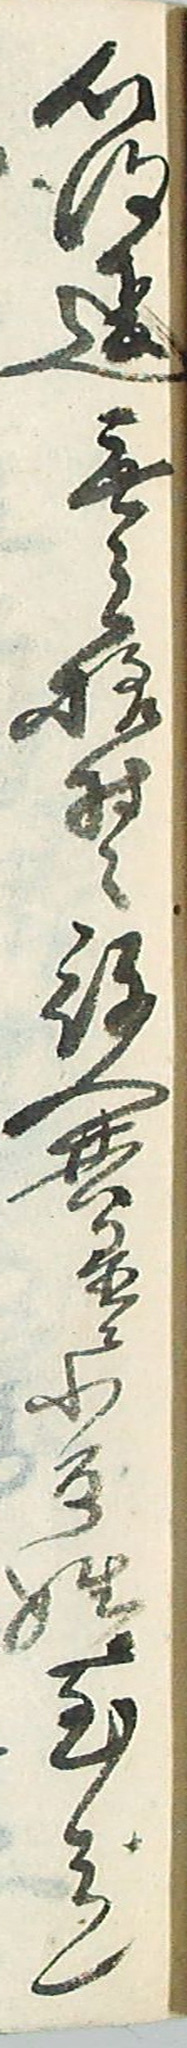心得違無之様村々役人共並に小百姓に至迄
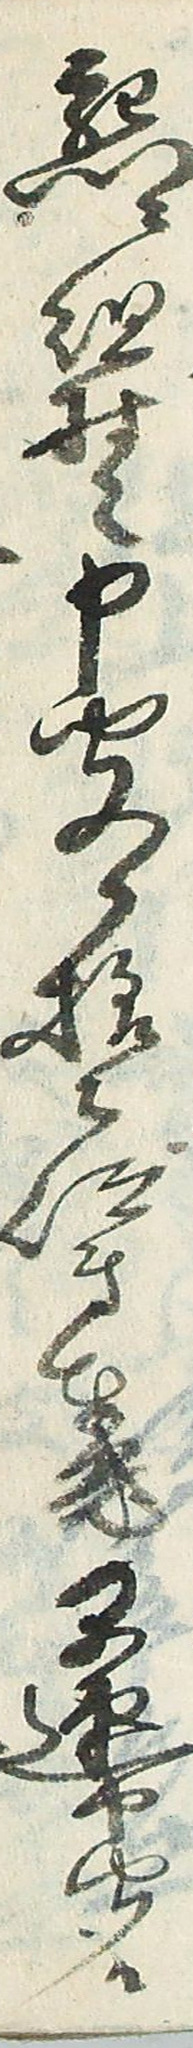懇に組村々申聞候様被仰付奉畏早速申聞候
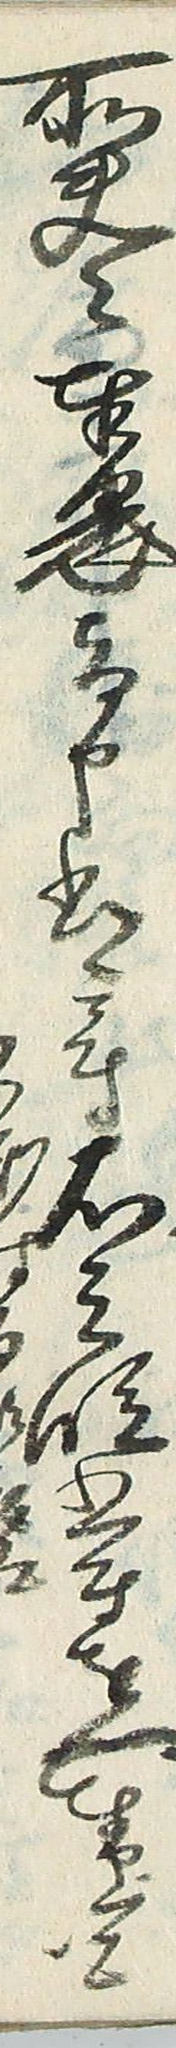所夫々奉畏旨申出候に付右之段書付を以奉申上候以上
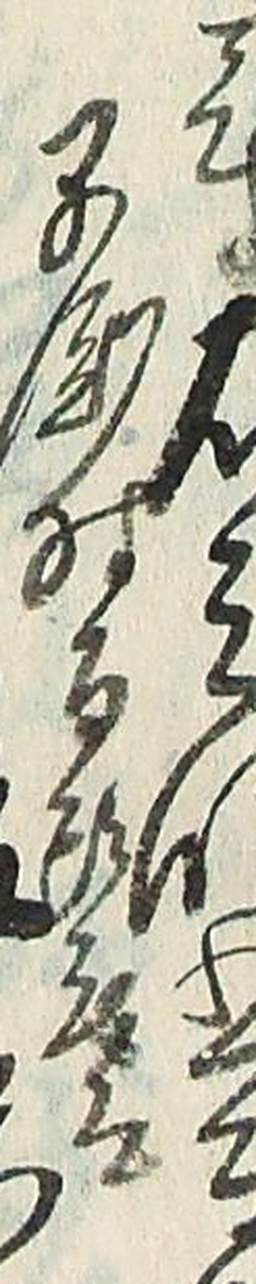早淵村与頭庄屋
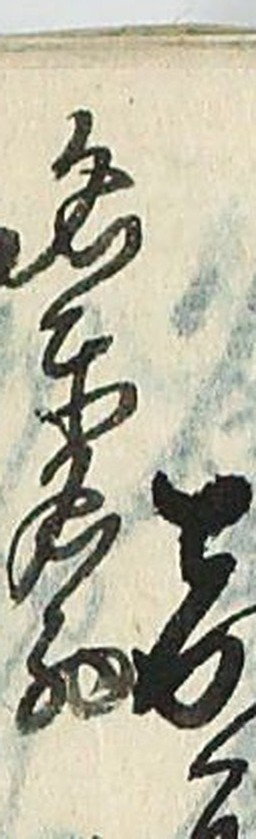名東名西
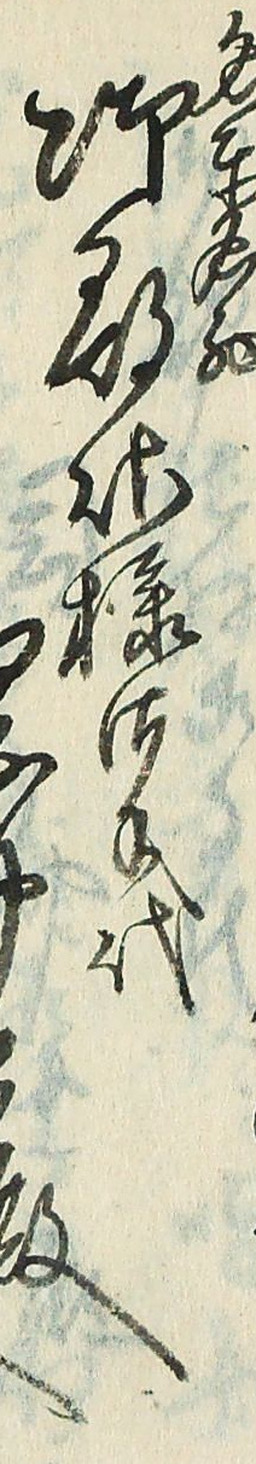御郡代様御手代
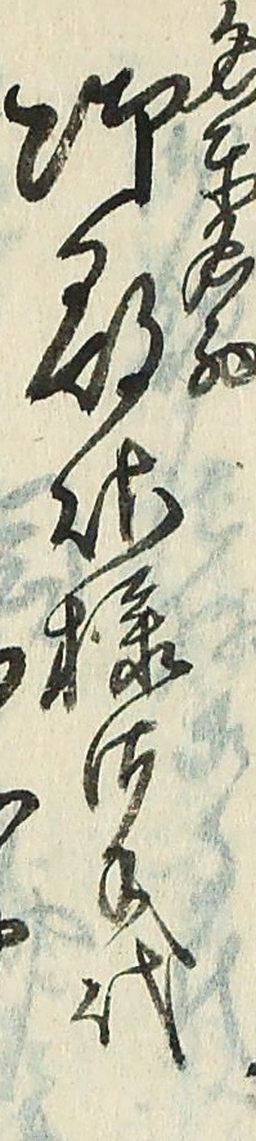御郡代様御手代
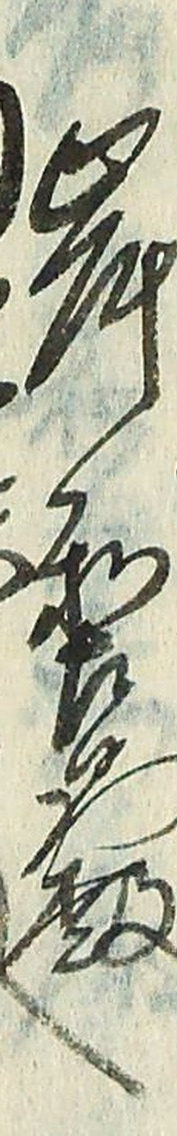岸和左衛門殿
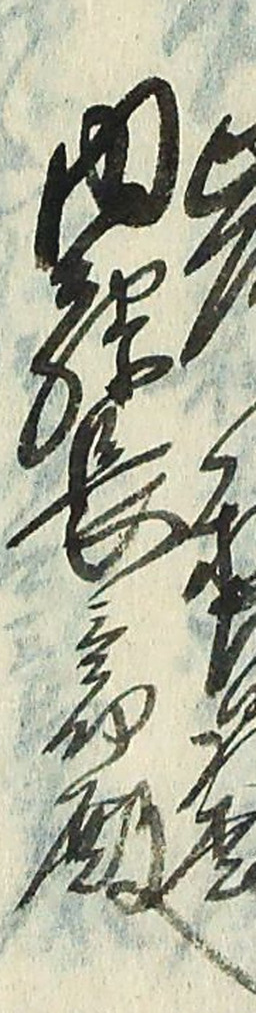内藤長三郎殿
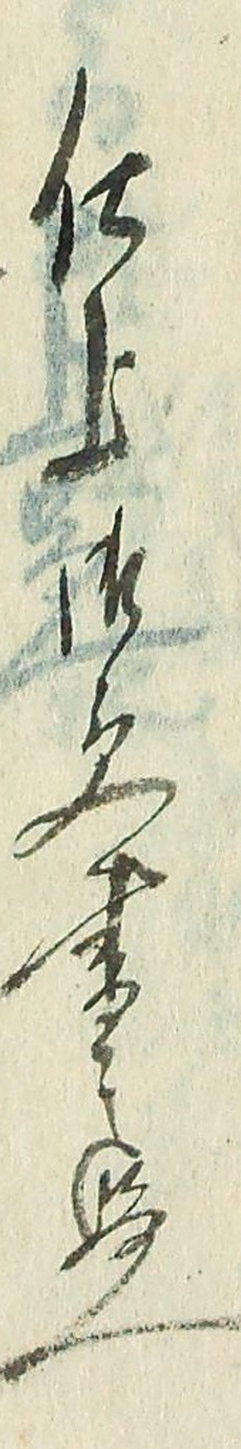仕上御受書之覚
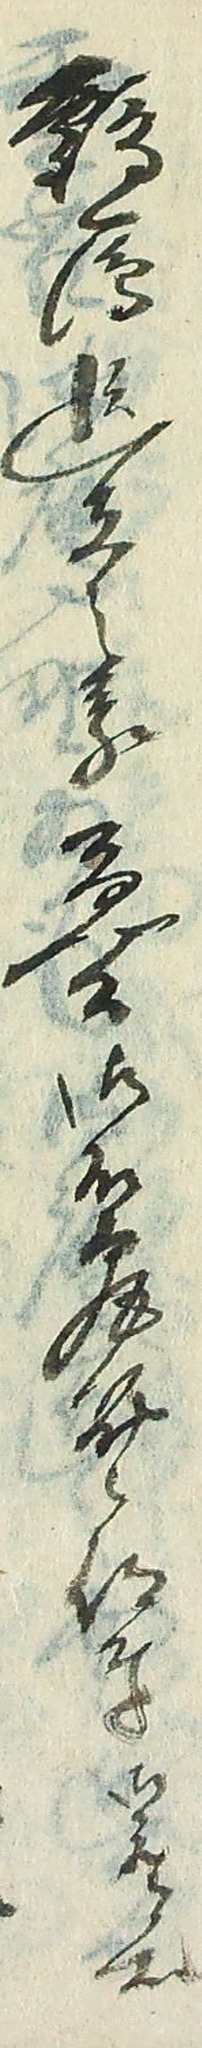鶴鳫追立之義兼而御取究筋被仰付御座候所
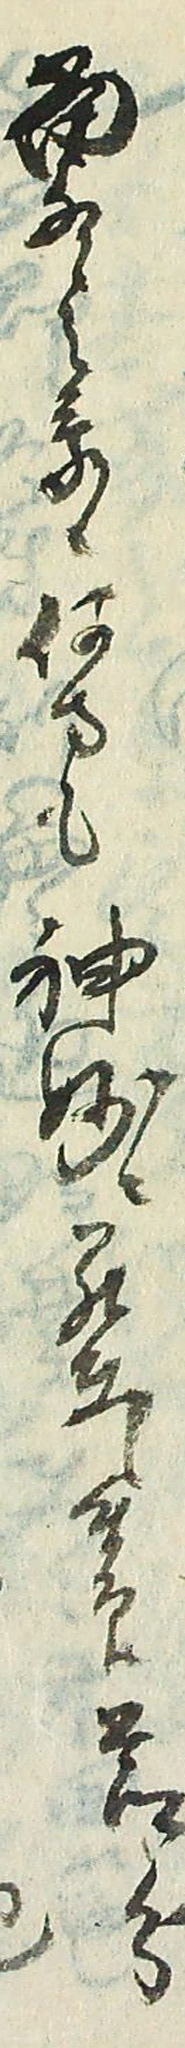当冬之義は何方も神妙に罷在候付而は節分
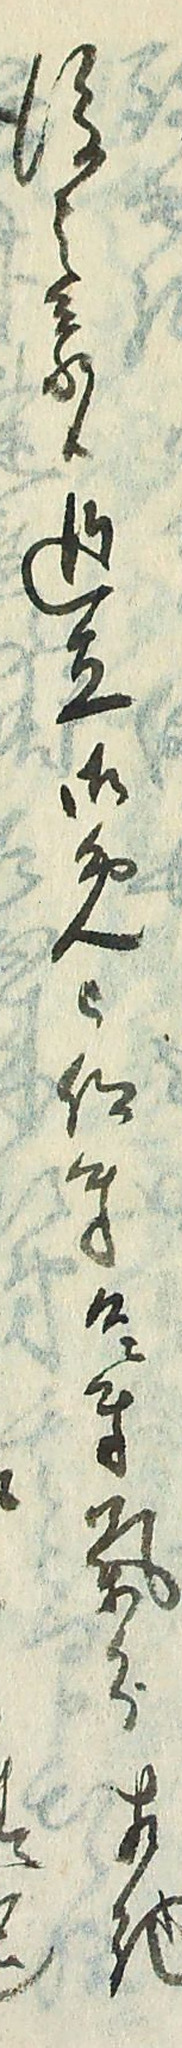後之義は追立御免被仰付候に付気分相弛
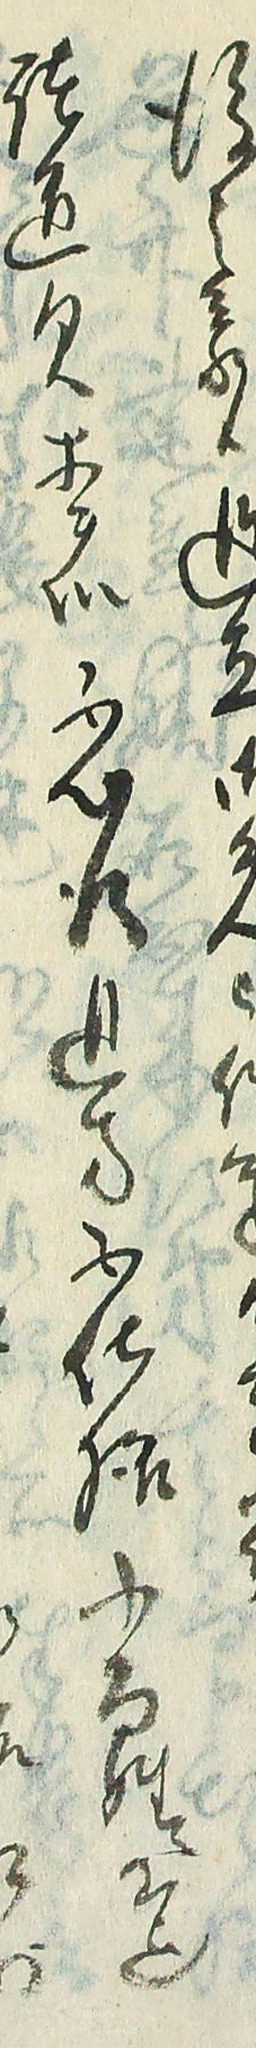諸道具等を以不心得追方不仕様小百姓に至迄
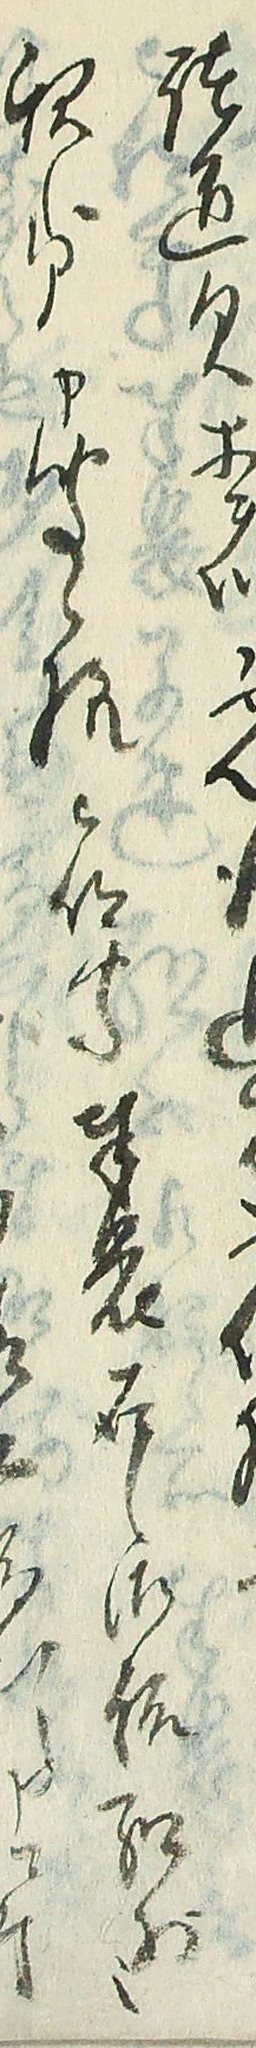親布申聞候様被仰付奉畏右之御趣組村へ
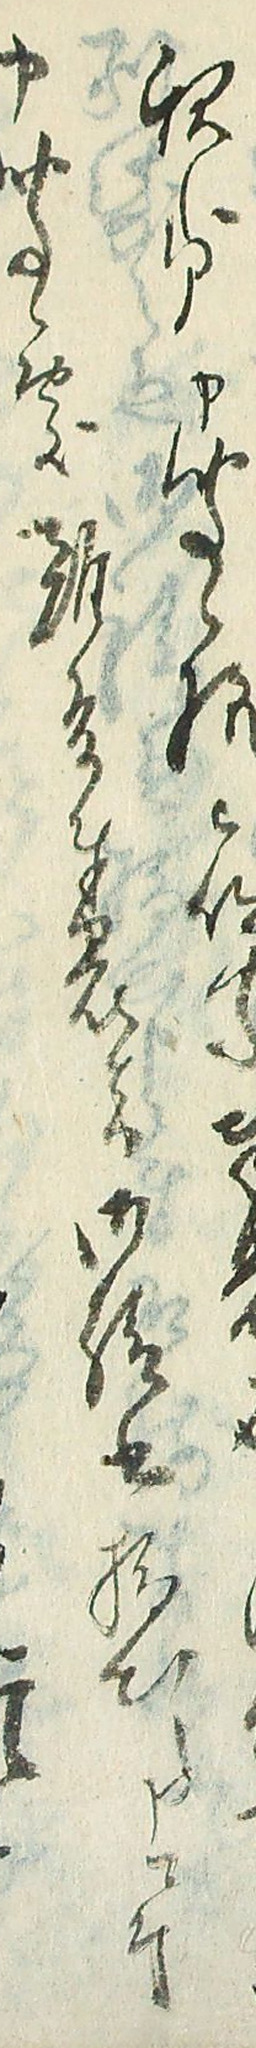申聞候処難有奉畏旨御請書指出し申に付
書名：諸御用御□受書控
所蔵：鳴門教育大学 Naruto University of Education
